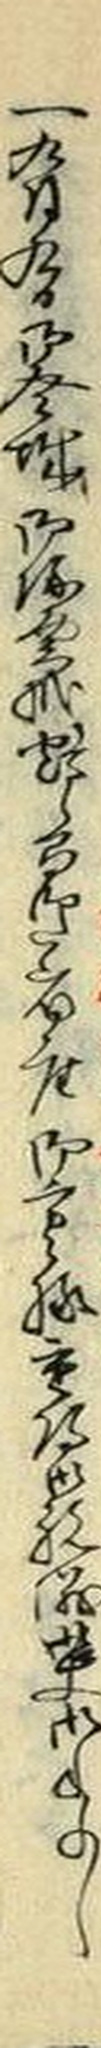一九月九日御登城御帰殿掛鶴之間御着座御方々様重陽御祝儀御使御手のし
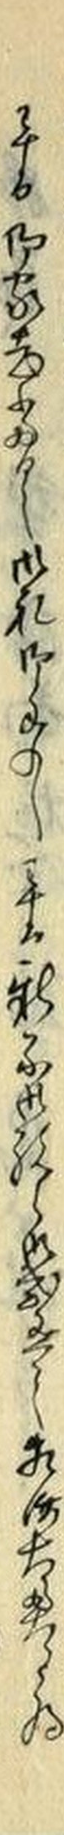畢而御家老当日之御礼御手のし畢而新米御祝之御式有之相済大奥被為
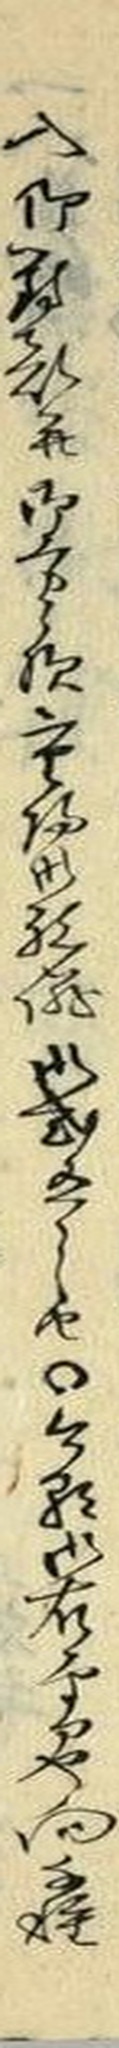入御対顔并御方々様重陽御祝儀御式有之候由〇今朝御右筆部や向千種
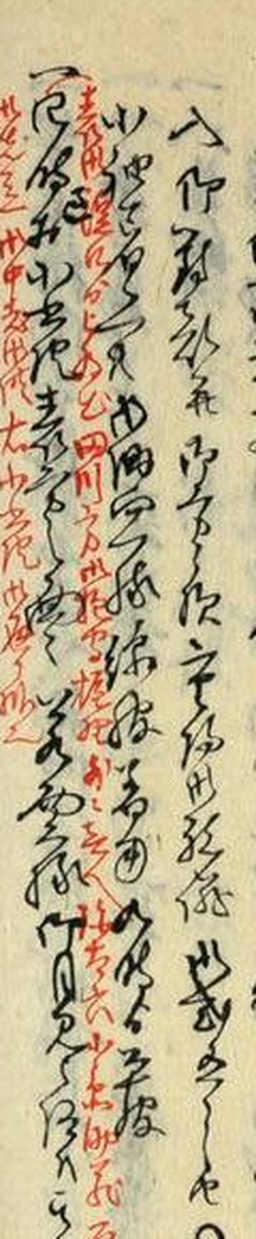小袖着候へ共御側向一統綿服着用九時ゟ平服
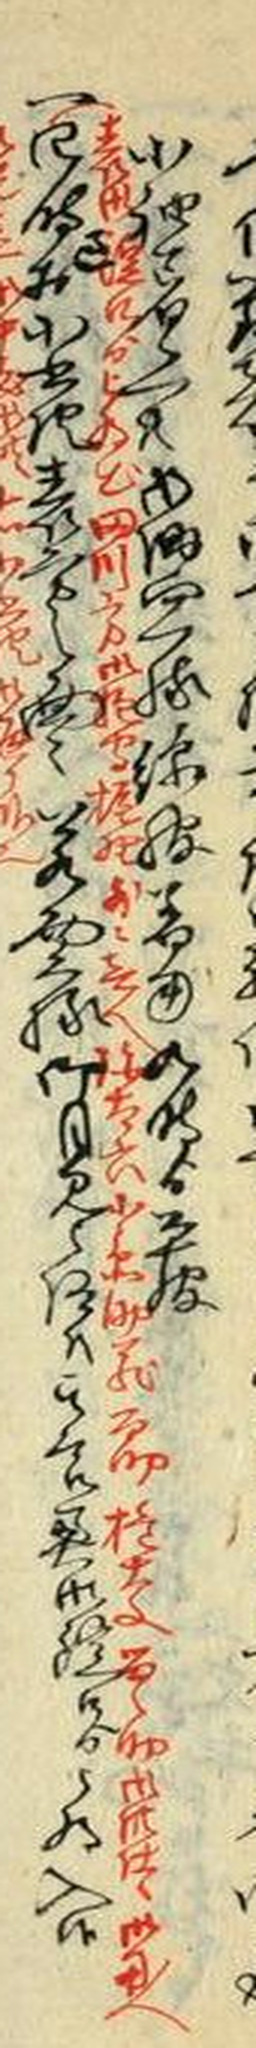一四時過於小書院表方之面々若殿様御目見被仰付其節奥御錠口ゟ被為入候
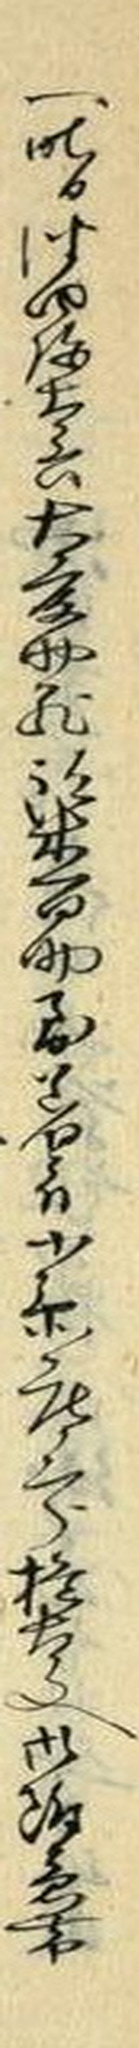一昨日津田弥太六大藤助蔵鈴木百助到着ニ付小兵衛庄三郎権太夫御附兼帯
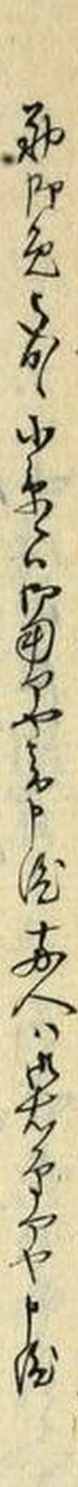勤御免被成候小兵衛ハ御用部やニ而申渡両人ハ御右筆部や申渡
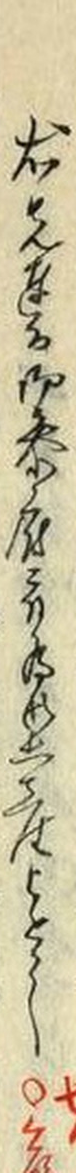右先達而御参府ニ付為御土産被進之
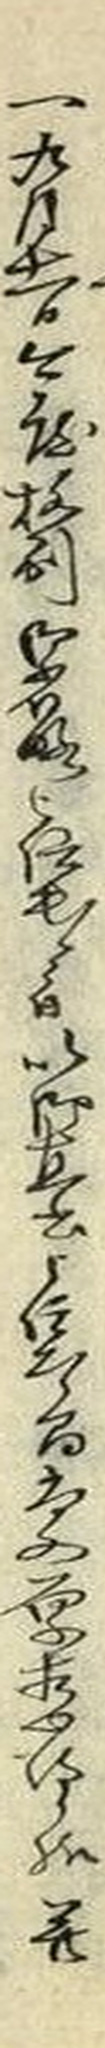一九月十一日今度格別御省略被仰出候ニ付以御直書被仰出候間尚又厚相心得候様并
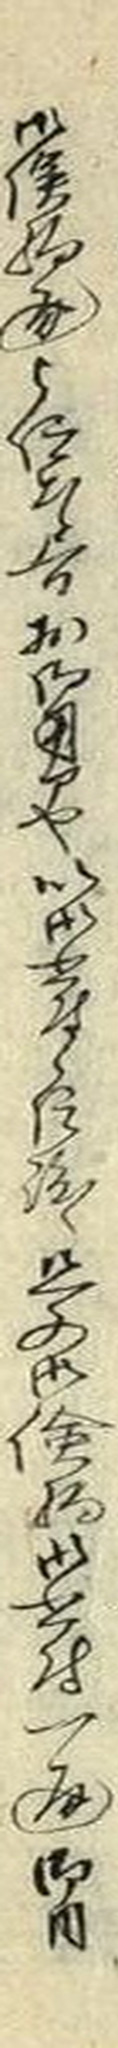御倹約通被仰出候旨於御用部や以御書付被仰渡候且又御倹約御書付一通御目
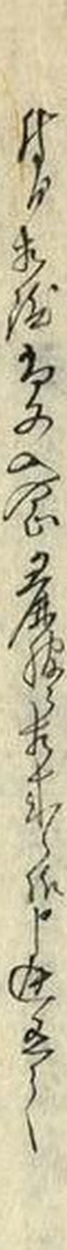付ゟ相渡尚又入念麁服ニ相成候様申達有之
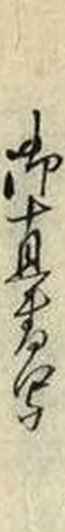御直書写
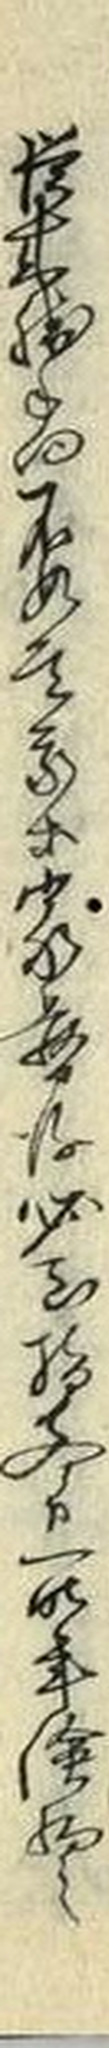従来勝手向不如意我等家督後必至指支候付一昨年倹約之
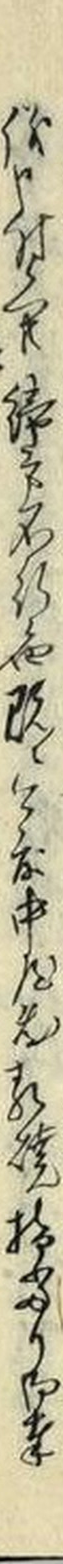儀申付候へ共締方不行届既ニ今度中屋敷類焼指当り御奉
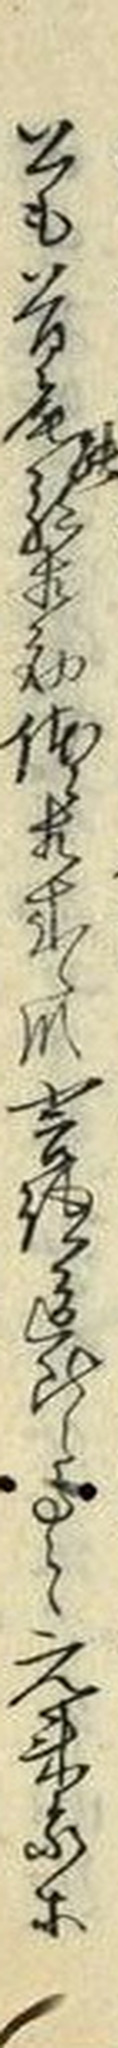公も首尾能難相勤体ニ相成候段言語道断之事ニ候元来我等
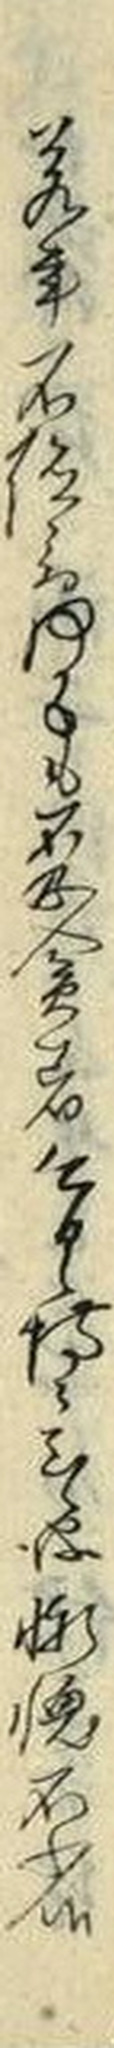若年不徳ニ而何事も不及貪着今日之場ニ至候儀慚愧不少候
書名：少傅日録抄（斉承付側向頭取日記、在府）
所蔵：福井県文書館 Fukui Prefectural Archives
